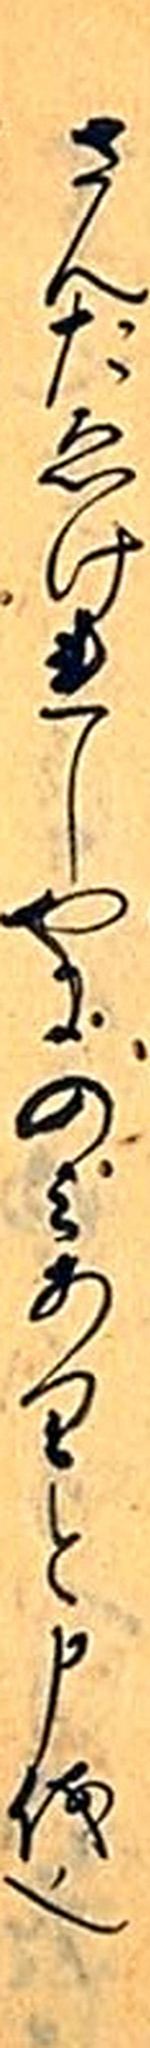さんたゑけれしやにのみありと申儀也
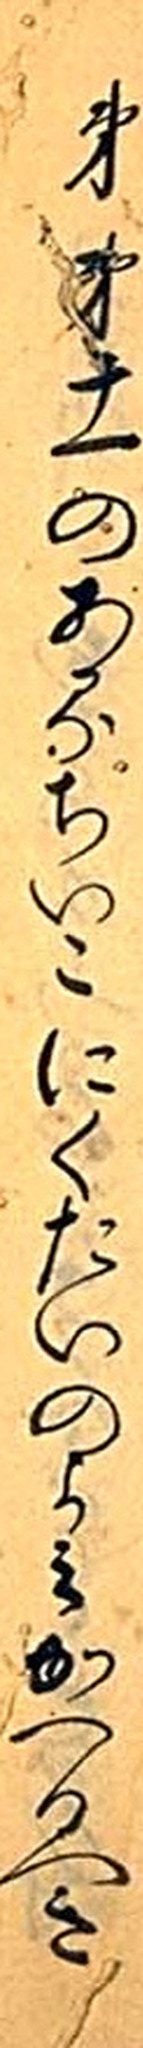弟第十一のあるちいこにくたいのよみかへるへき
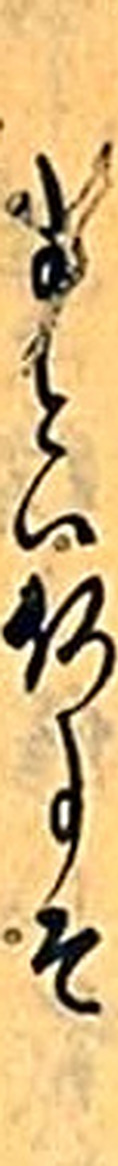事とは何事そ
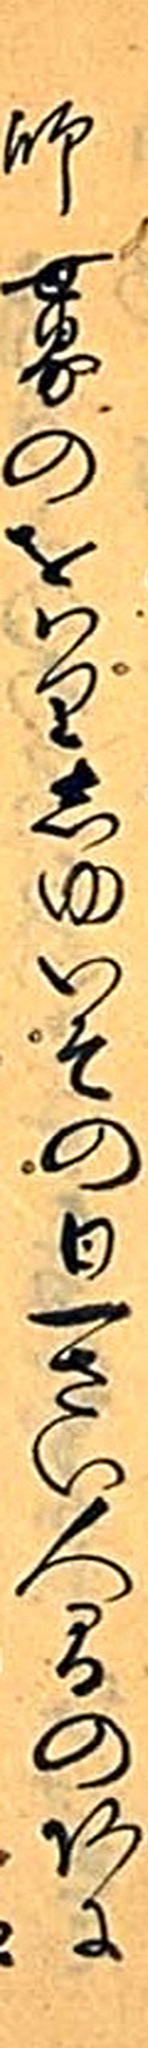師世界のをはりしゆいその日一さい人間のあに
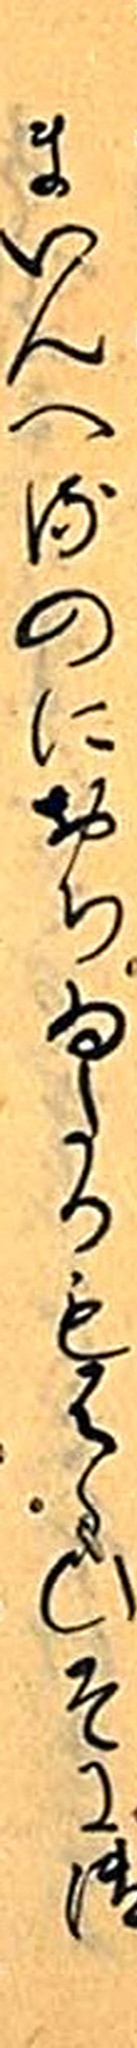まいんへるのにおちゐたるもはらひそに御
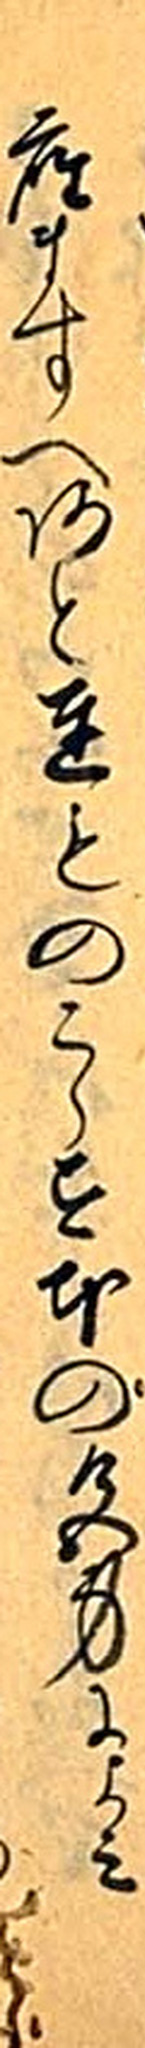座ますへあと達ものこらす本の色身によみ
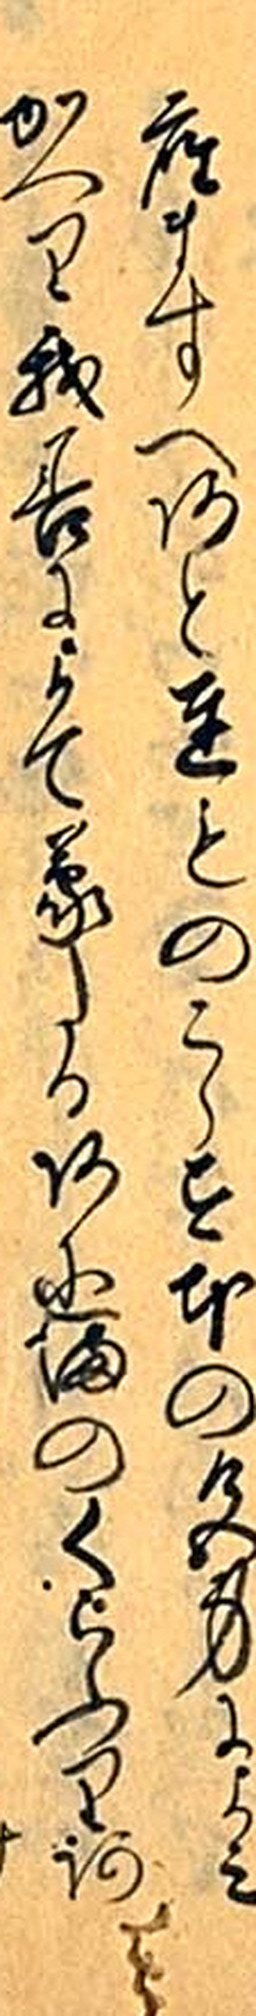かへり我善によて蒙たるあにまのくらうりあ
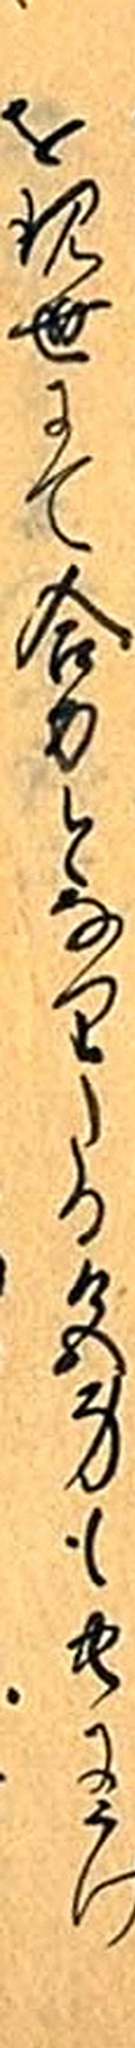を現世にて合力となりたる色身も共にうけ
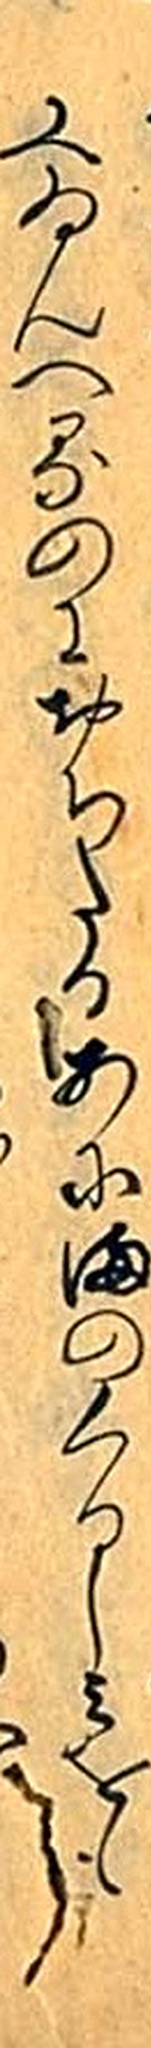又ゐんへるのにおちたるあにまのくるしみをも
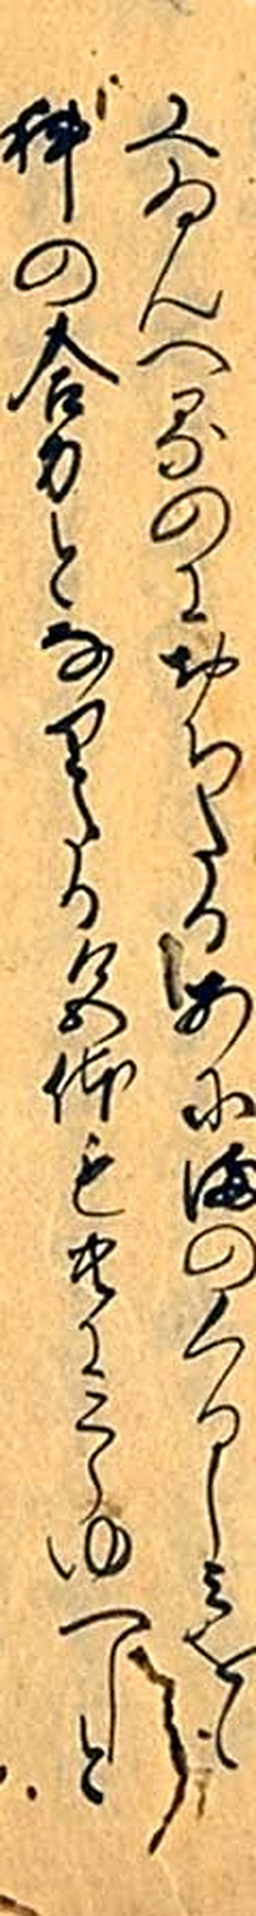科の合力となりたる色体も共にこらゆへしと
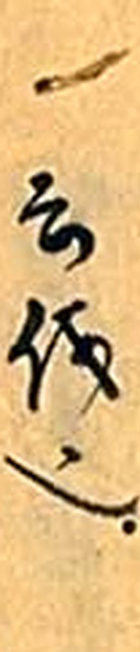云儀也
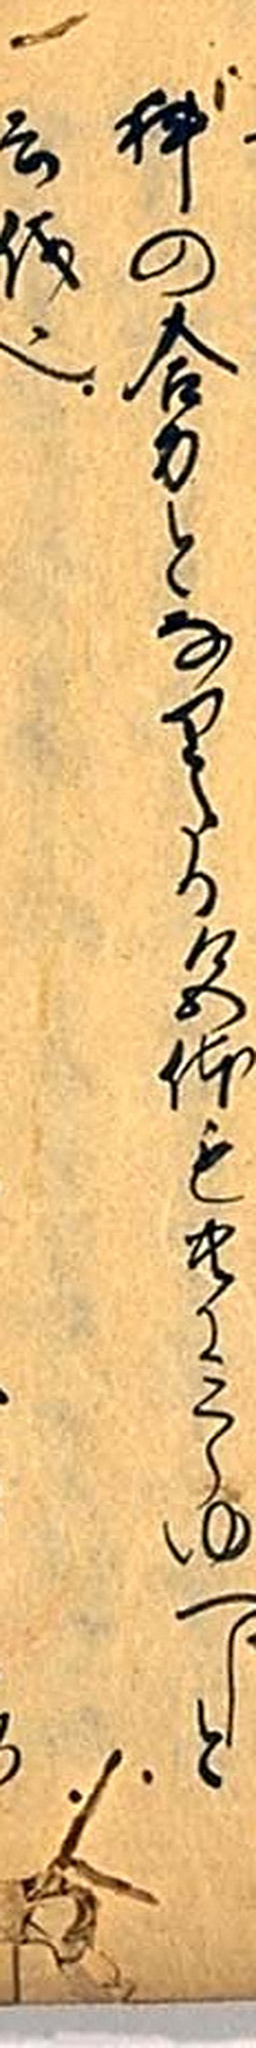云儀也
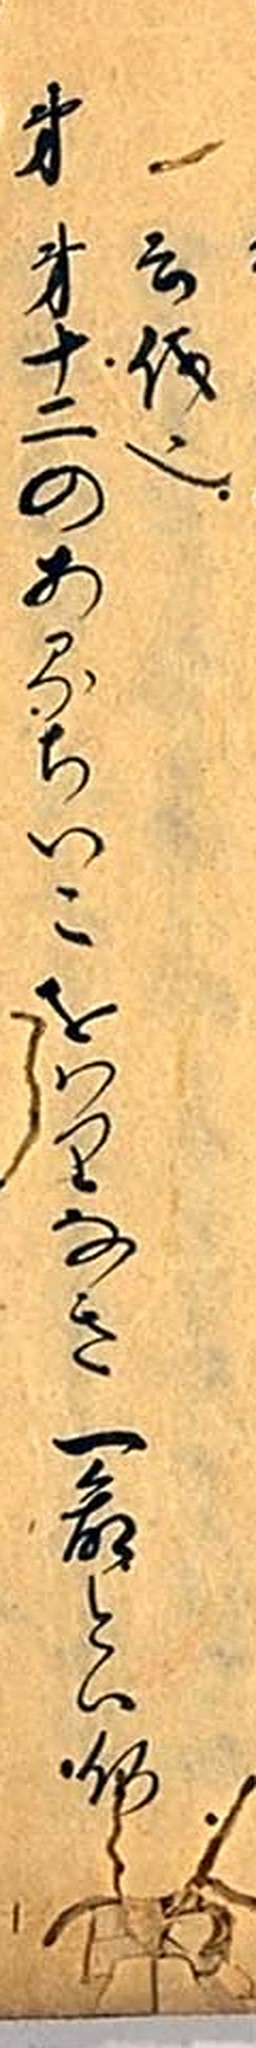弟第十二のあるちいこをはりなき一命とは何
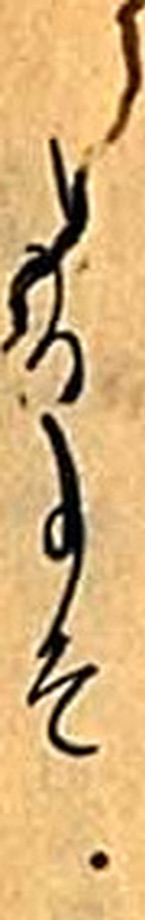たる事そ
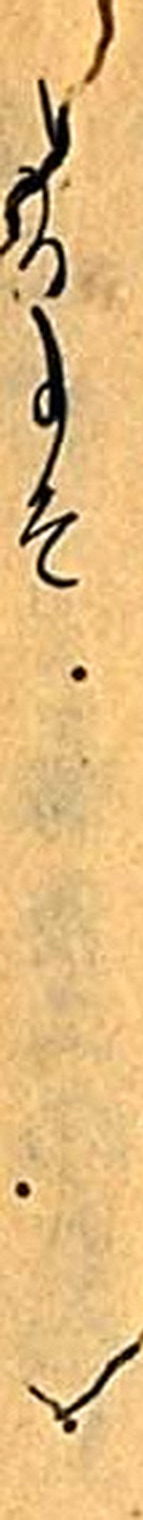たる事そ
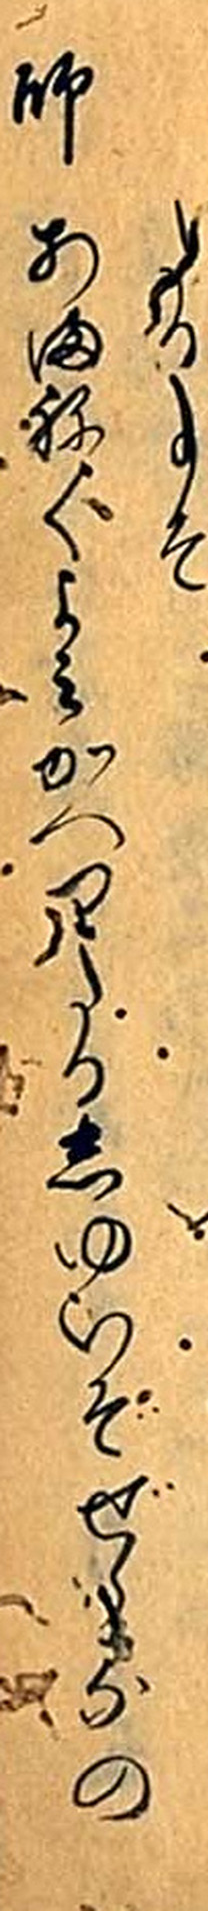師あまねくよみかへりたるじゆいそせらるの
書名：ドチリナ・キリシタン
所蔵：東京大学総合図書館 / General Library in the University of Tokyo
